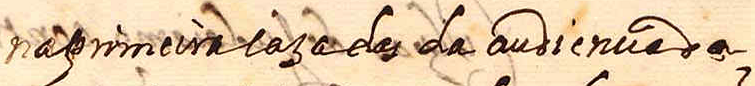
na primeira caza das da audiencia da
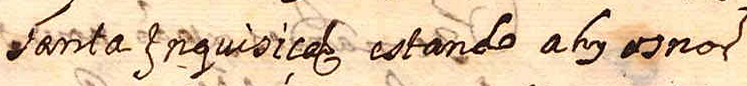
Santa Jnquisiçaõ estando ahy o snor̄
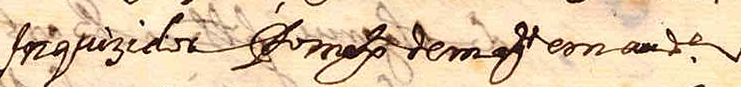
Jnquizidor Po Mexia de mg.es em aud.a
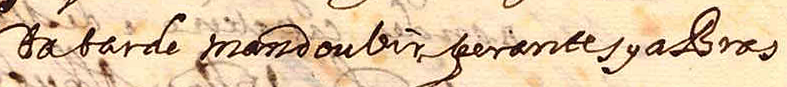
da tarde mandou Vir perante sy a Bras
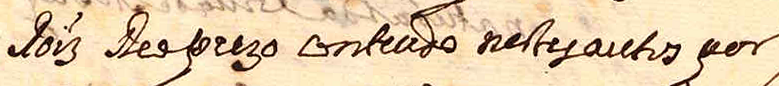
Roiz̄ Reo prezo conteudo nestes autos por
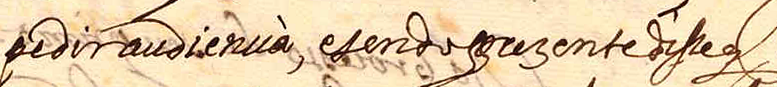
pedir audiencia, e sendo prezente disse q̄
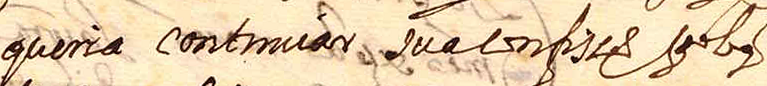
queria continuar sua confissaõ pelo q̄
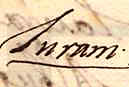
Iuram.
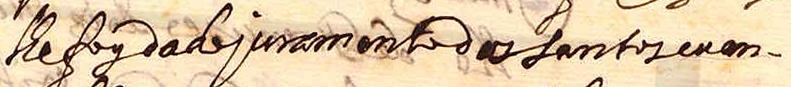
lhe foy dado juramento dos Santos evan
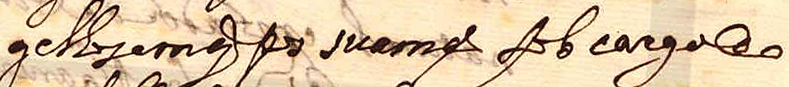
gelhos em q̄ pos sua maõ sob cargo do
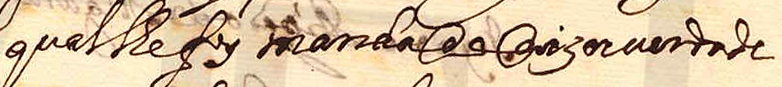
qual lhe foy mandado dizer uerdade
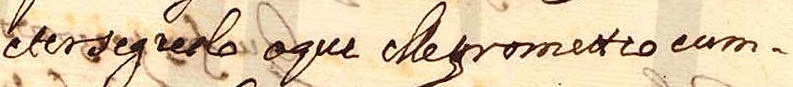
e ter segredo o que elle prometteo cum
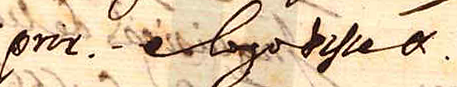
prir e logo disse &.
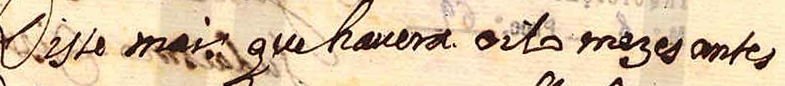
Disse mais que havera oito mezes antes
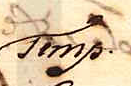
Temp.
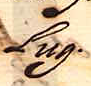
Lug.
